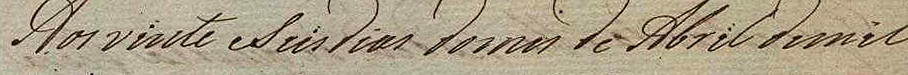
Aos vinte e Seis dias do mes de Abril de mil
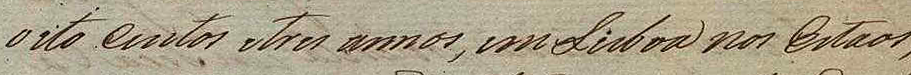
oitocentos e tres annos, em Lisboa nos Estaos,
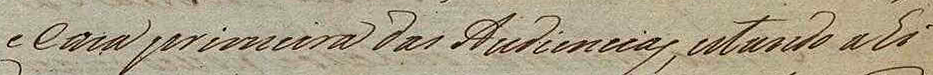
e casa primeira das Audiencias, estando ahi
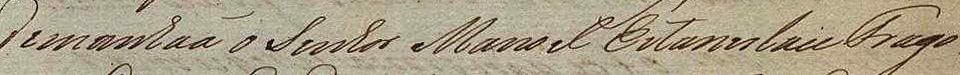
de manhaã o Senhor Manoel Estanislau Frago
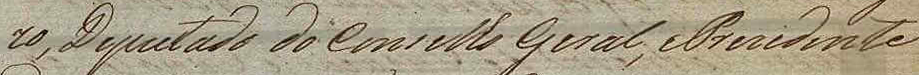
zo, Deputado do conselho Geral, e Prezidente
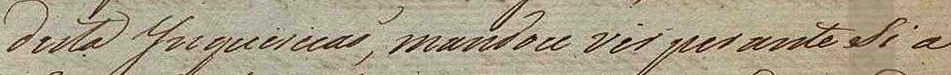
desta Jnquisicaõ, mandou vir perante Si a
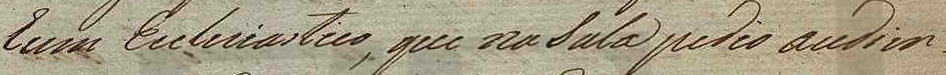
hum Ecclesiastico, que na Sala pedio audien
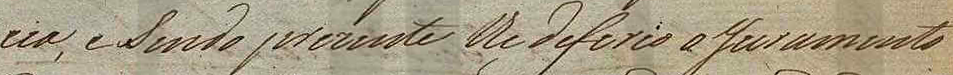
cia, e Sendo prezente lhe deferio o Juramento
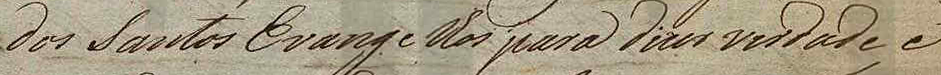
dos Santos Evangelhos para dizer verdade, e
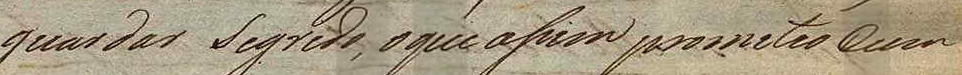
guardar Segredo, o que assim prometeo cum
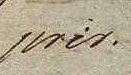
prir.
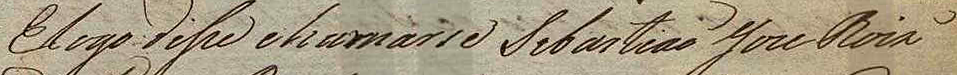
E logo disse chamarse Sebastiaõ Joze Roiz̄
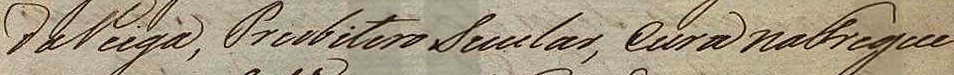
da Veiga, Presbitero Secular, cura na Fregue
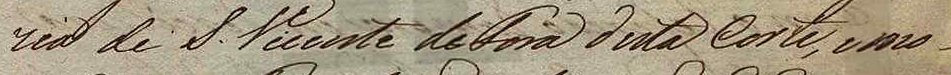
zia de S. Vicente de Fora desta corte, e mo
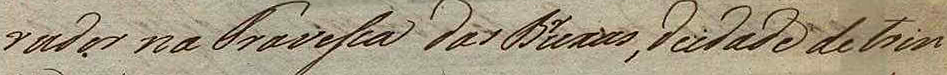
rador na Travessa das Bruxas, de idade de trin
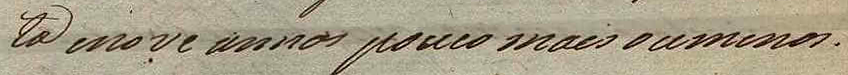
ta e nove annos pouco mais ou menos.
